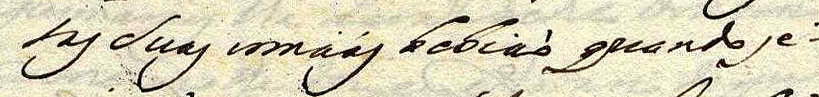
tas suas irmaãs bebiaõ quando je
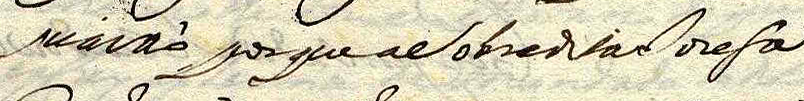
juaraõ porque a sobredita Iozefa
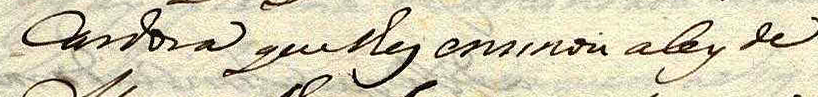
Cardoza que lhes ensinou a ley de
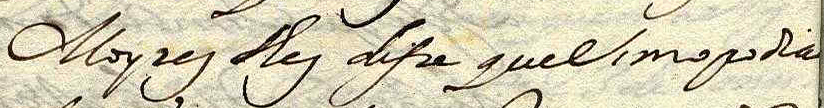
Moyzes lhes disse que sim o podia
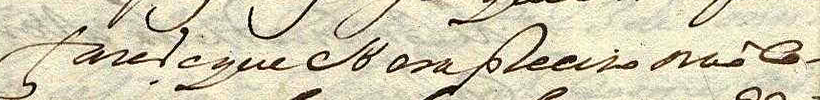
fazer, e que só era precizo naõ Co
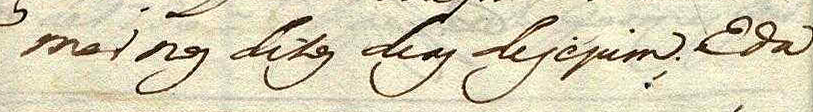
mer nos ditos dias de jejum; E da
